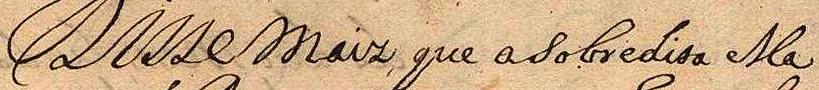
Disse Maiz, que a sobredita Ma
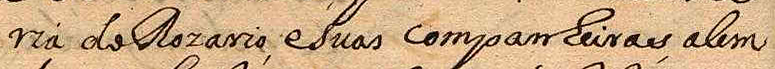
ria do Rozario, e suas companheiras, alem
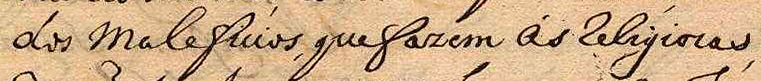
dos maleficios, que fazem ás Religiozas,
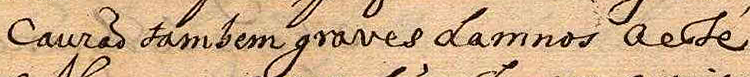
cauzão tambem graves damnos a este
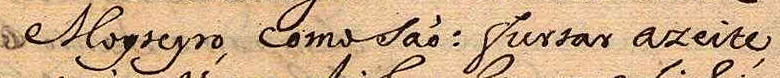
Mosteyro, como saõ: furtar azeite,
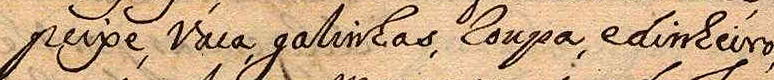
peixe, vaca, galinhas, Roupa, e dinheiro,
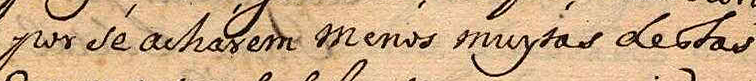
por se acharem menos muytas destas
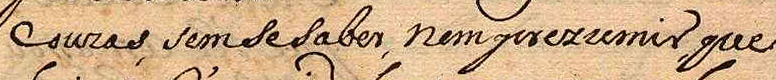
couzas, sem se saber, nem prezumir que
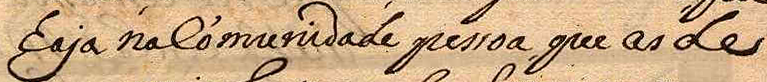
haja na Cōmunidade pessoa que as de
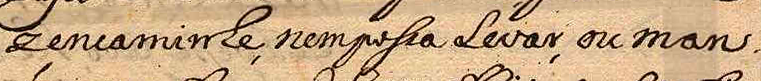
zencaminhe, nem possa Levar, ou man
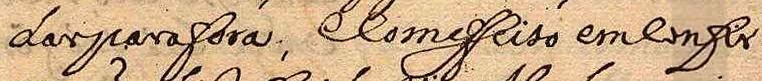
dar para fora, e com effeito em confir
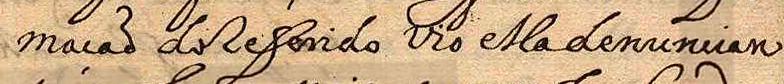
maçaõ do Referido vio ella denuncian
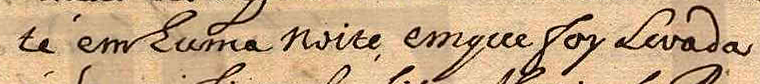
te em huma noite, em que foy Levada
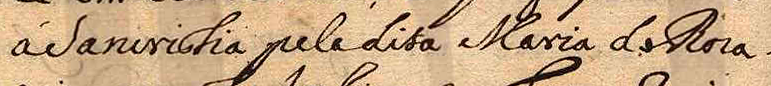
á Sancristia pela dita Maria do Roza
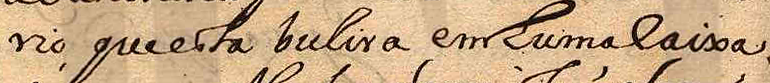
rio, que esta bulira em huma Caixa
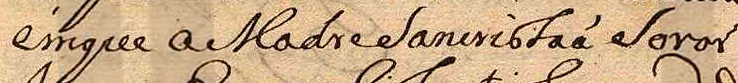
em que a Madre Sancristaã Soror
